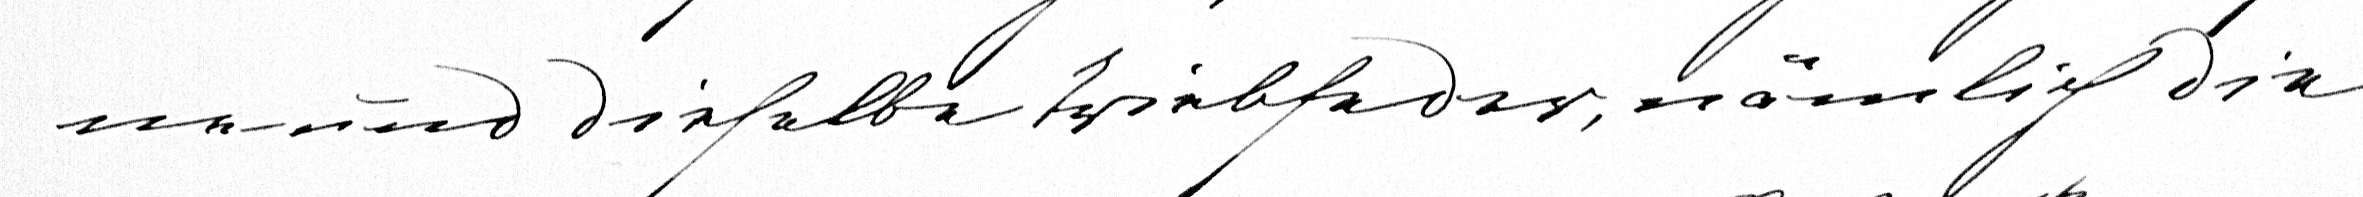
ne und dieselbe Triebfeder, nämlich die
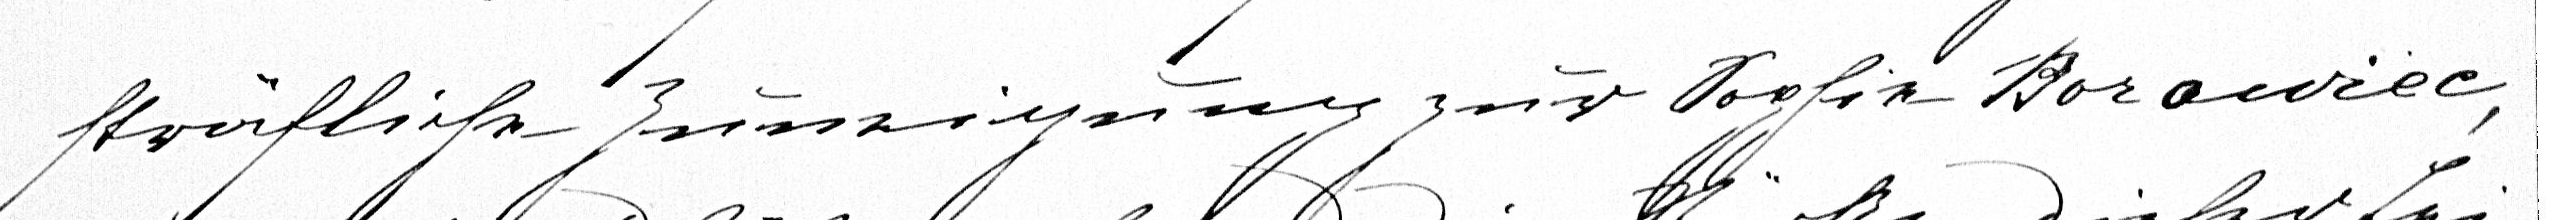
sträfliche Zuneigung zur Sophie Borowiec,
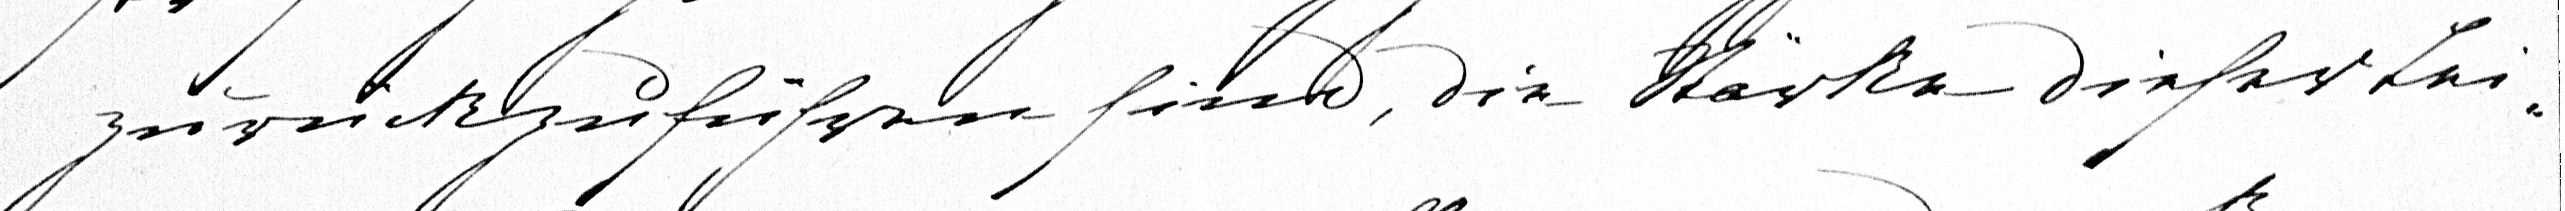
zurückzuführen sind, die Stärke dieser Lei¬
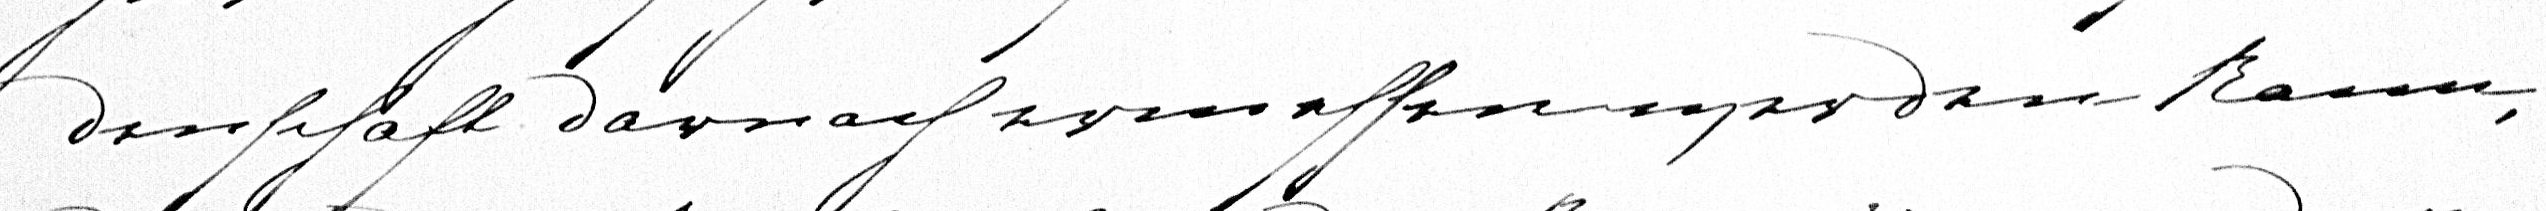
denschaft darnach ermessen werden kann,
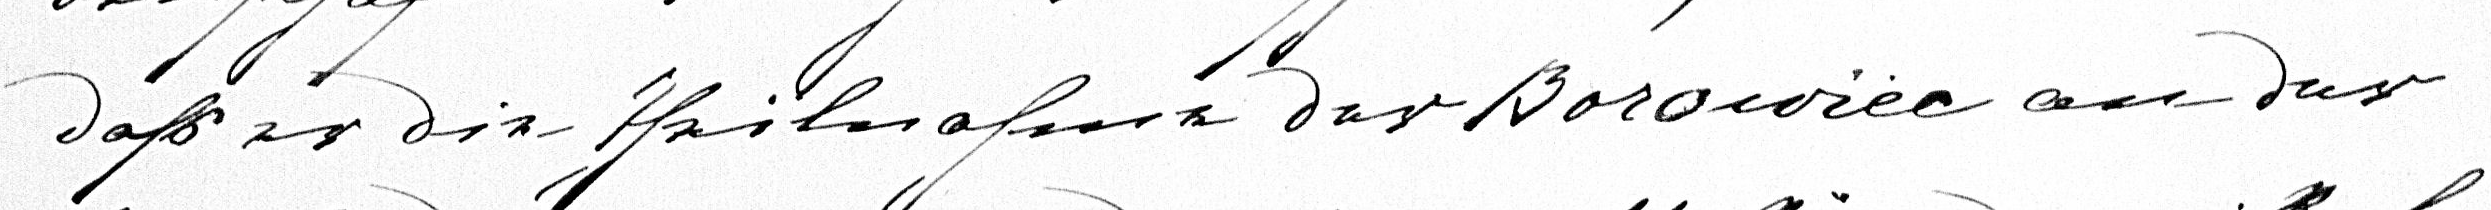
daß er die Theilnahme der Borowiec an der
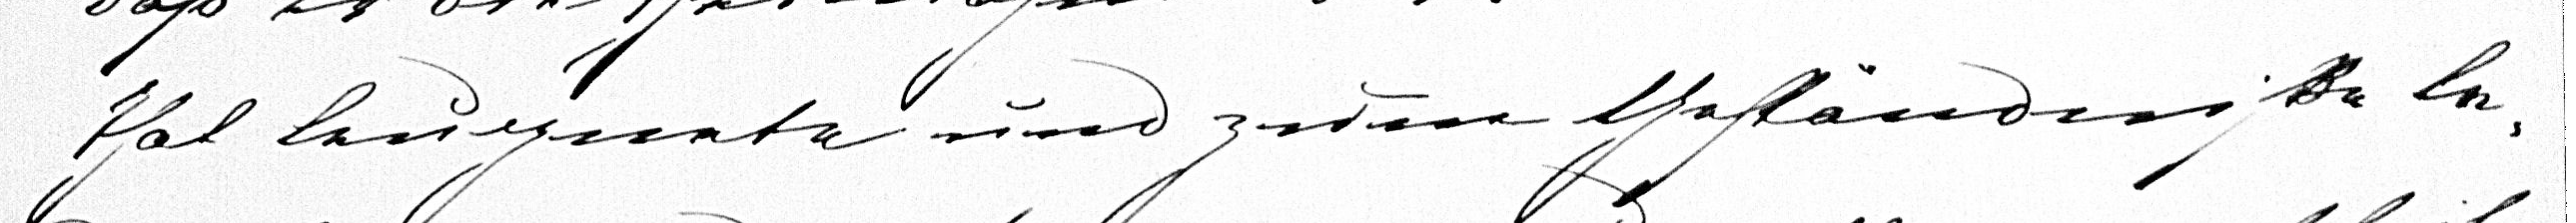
That leugnete und zum Geständniße le¬
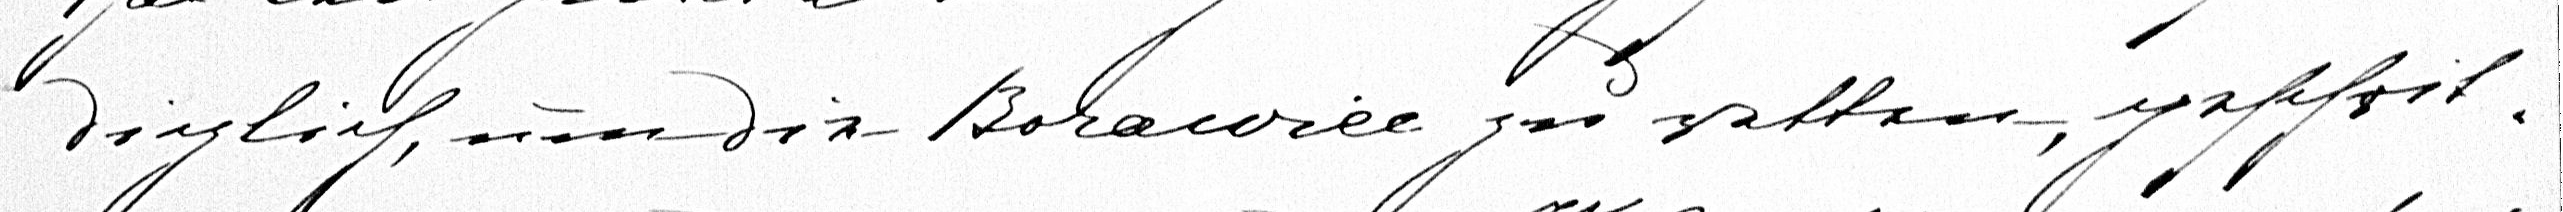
diglich, um die Borowiec zu retten, geschrit¬
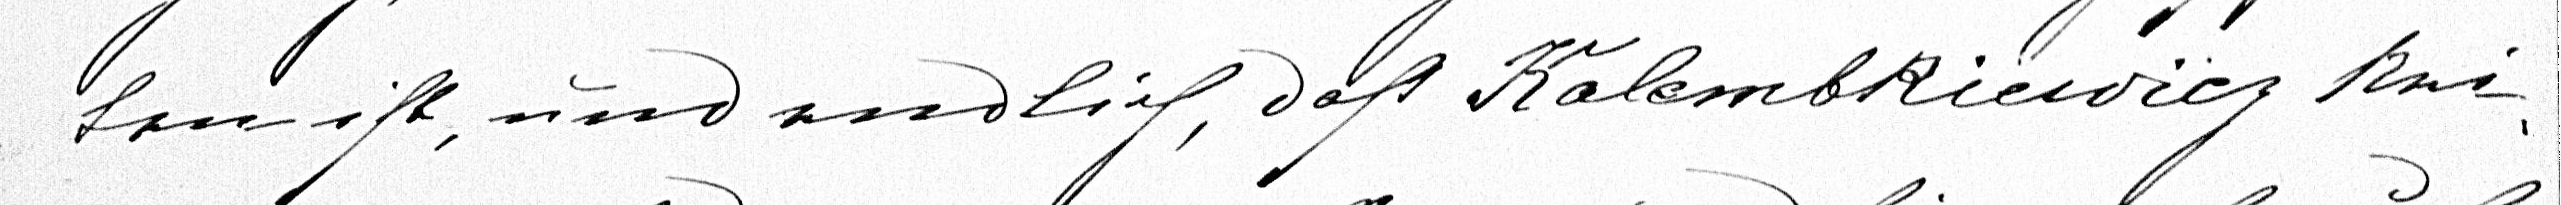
ten ist, und endlich, daß Kalembkiewicz kei¬
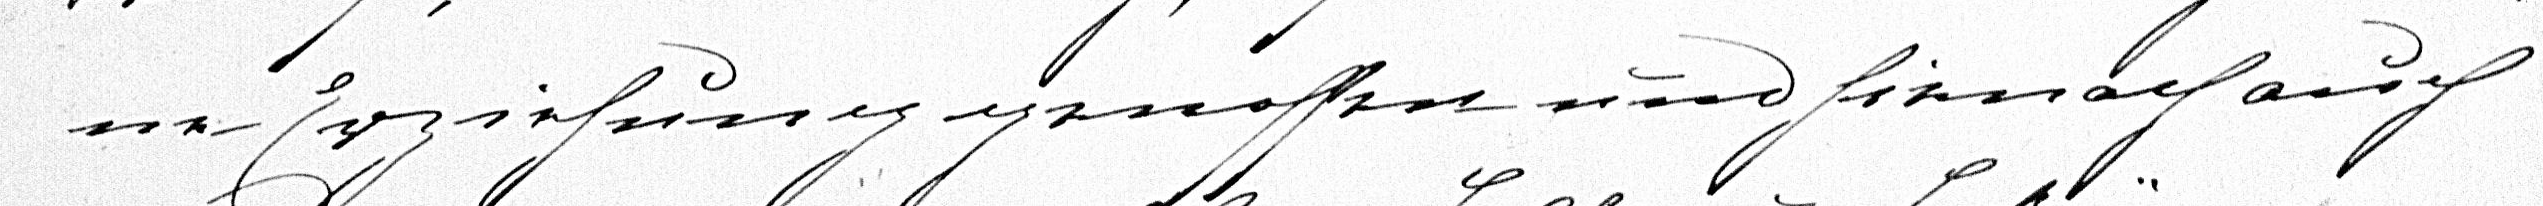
ne Erziehung genossen und hienach auch
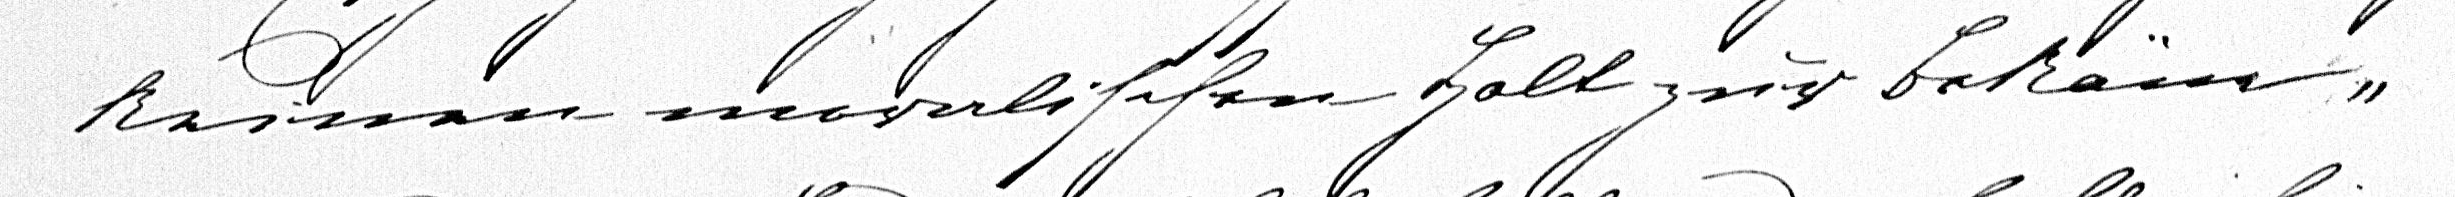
keinen moralischen Holt zur Bekäm¬
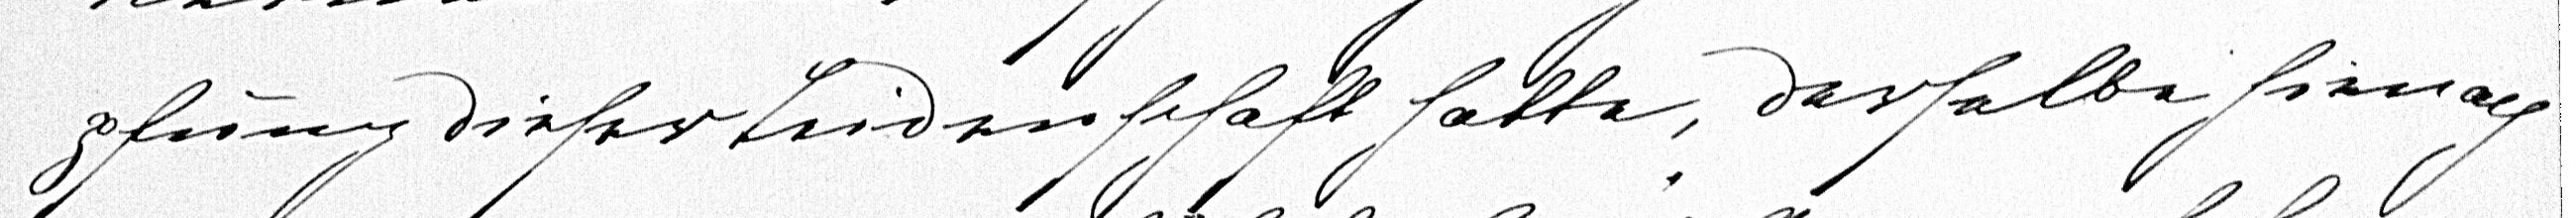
pfung dieser Leidenschaft hatte, derselbe hienach
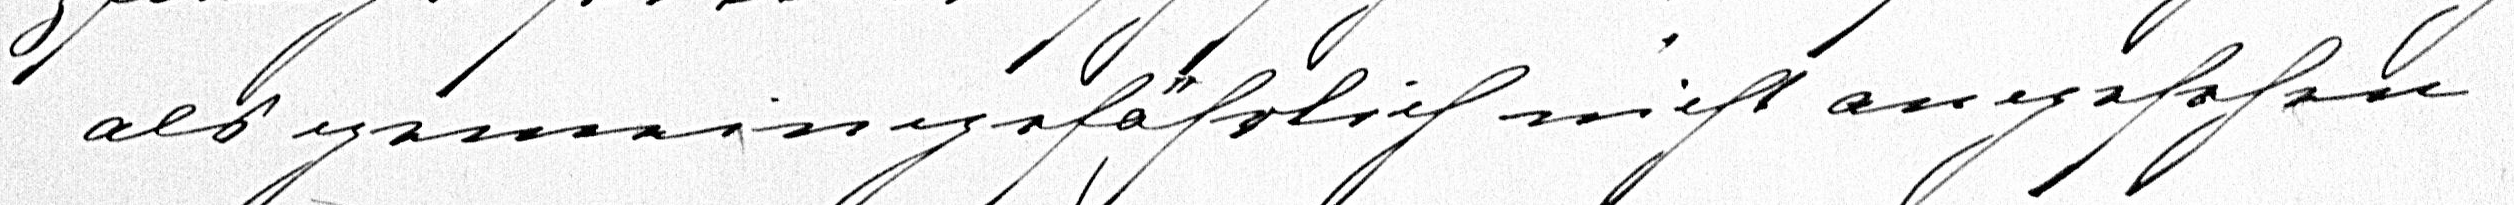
als gemeingefährlich nicht angesehen
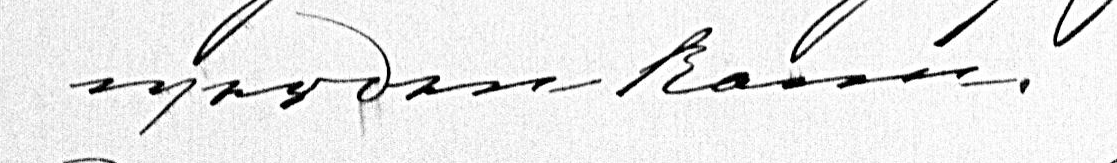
werden kann.
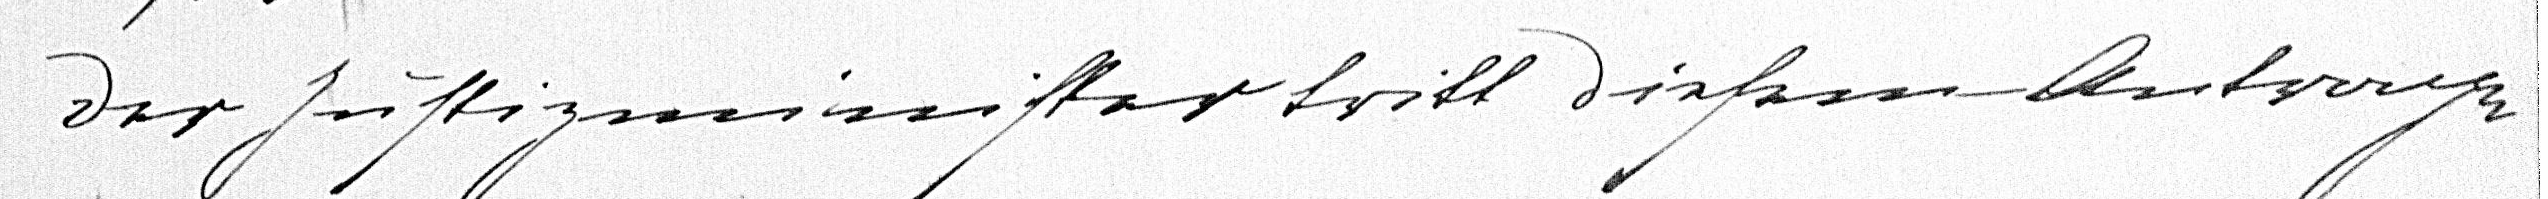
Der Justizminister tritt diesem Antrag-
